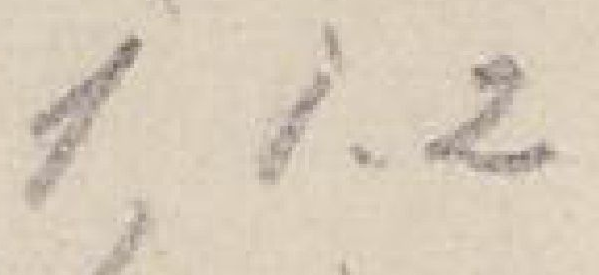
1,1.2
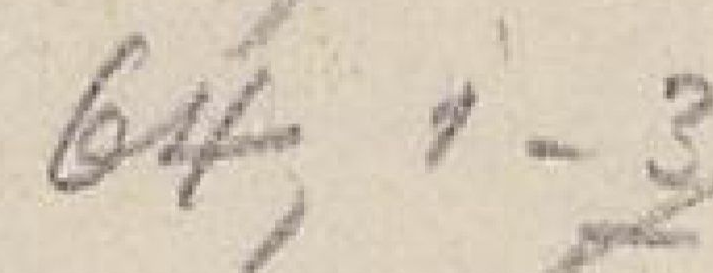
64,1-3
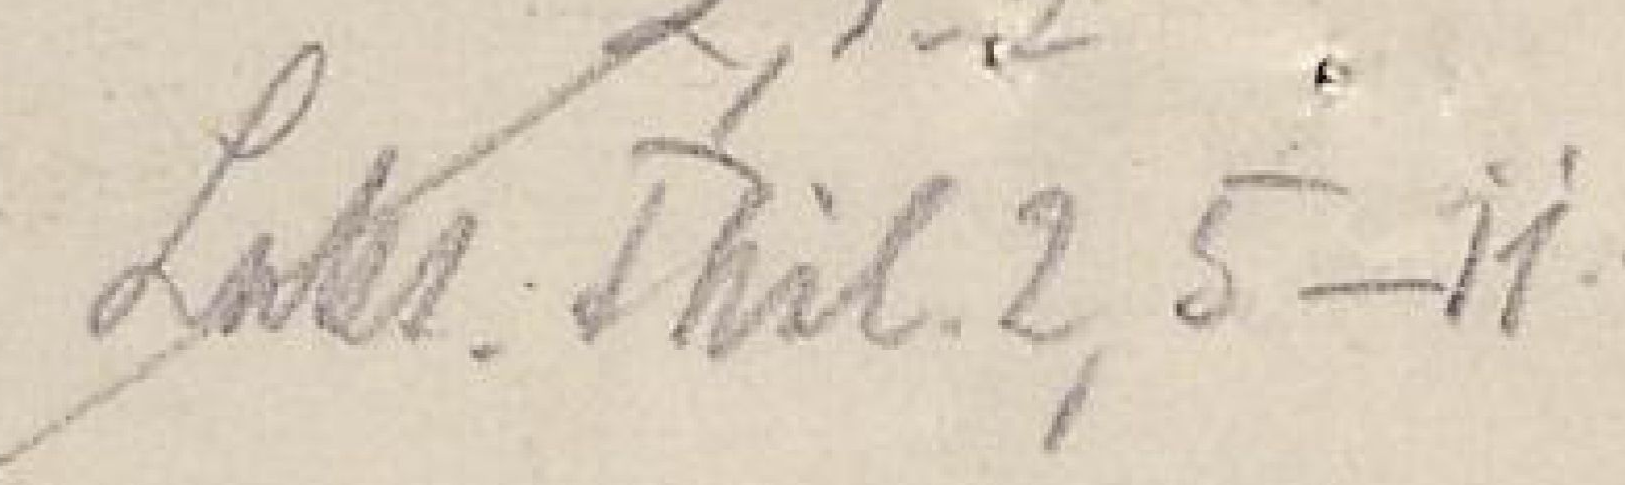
Phil 2,5-11
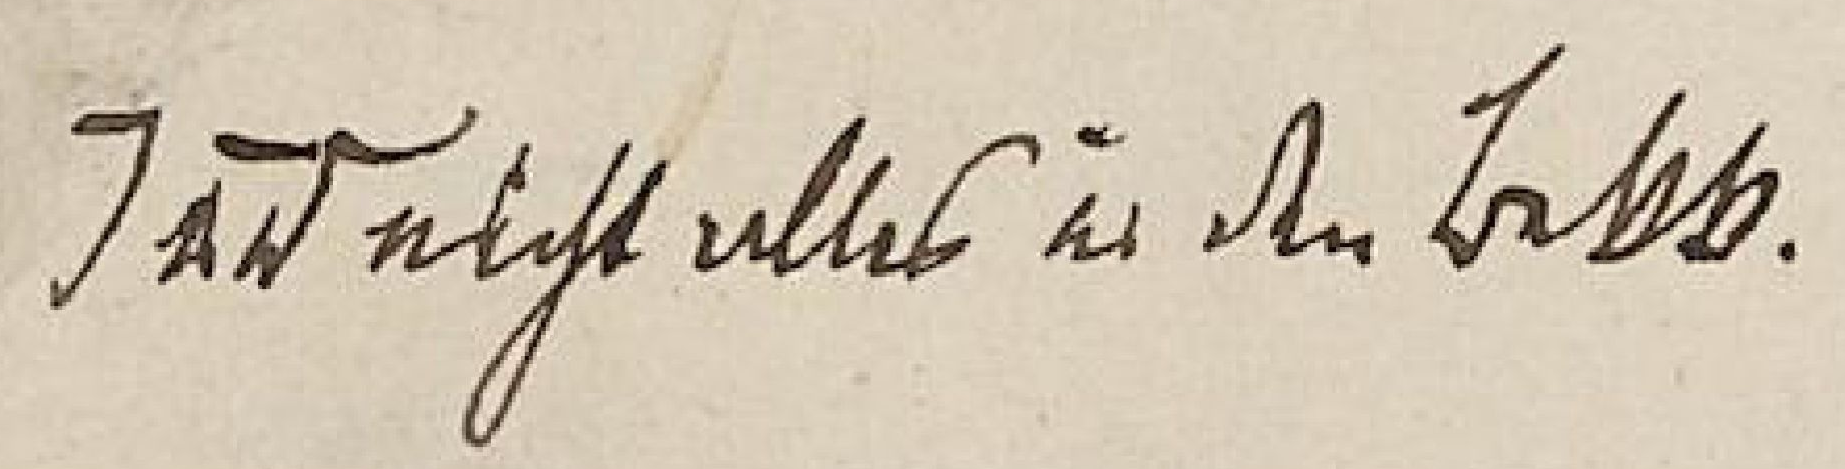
] und nicht alles in den Bekk.
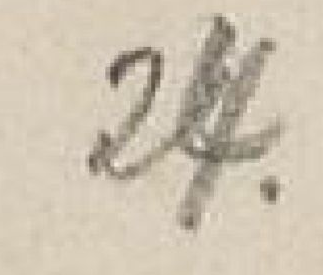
24
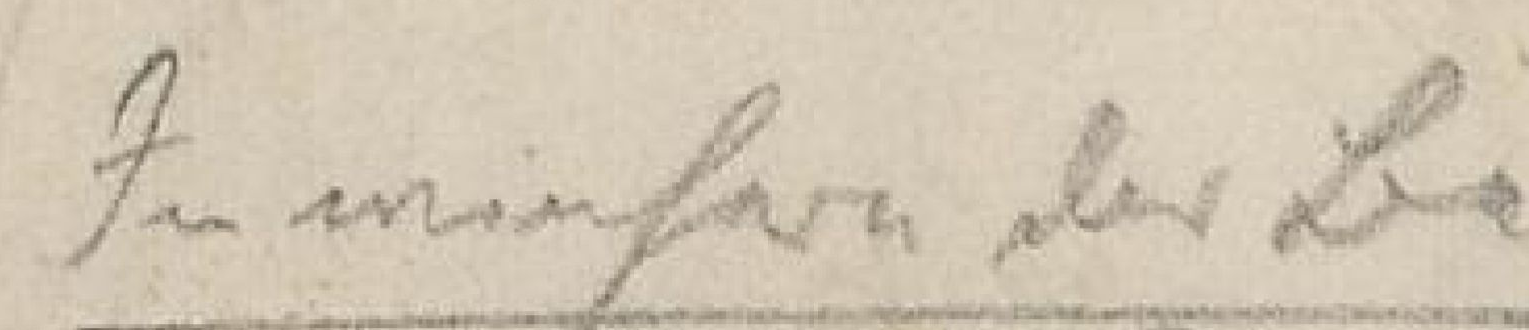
In wiefern das Be
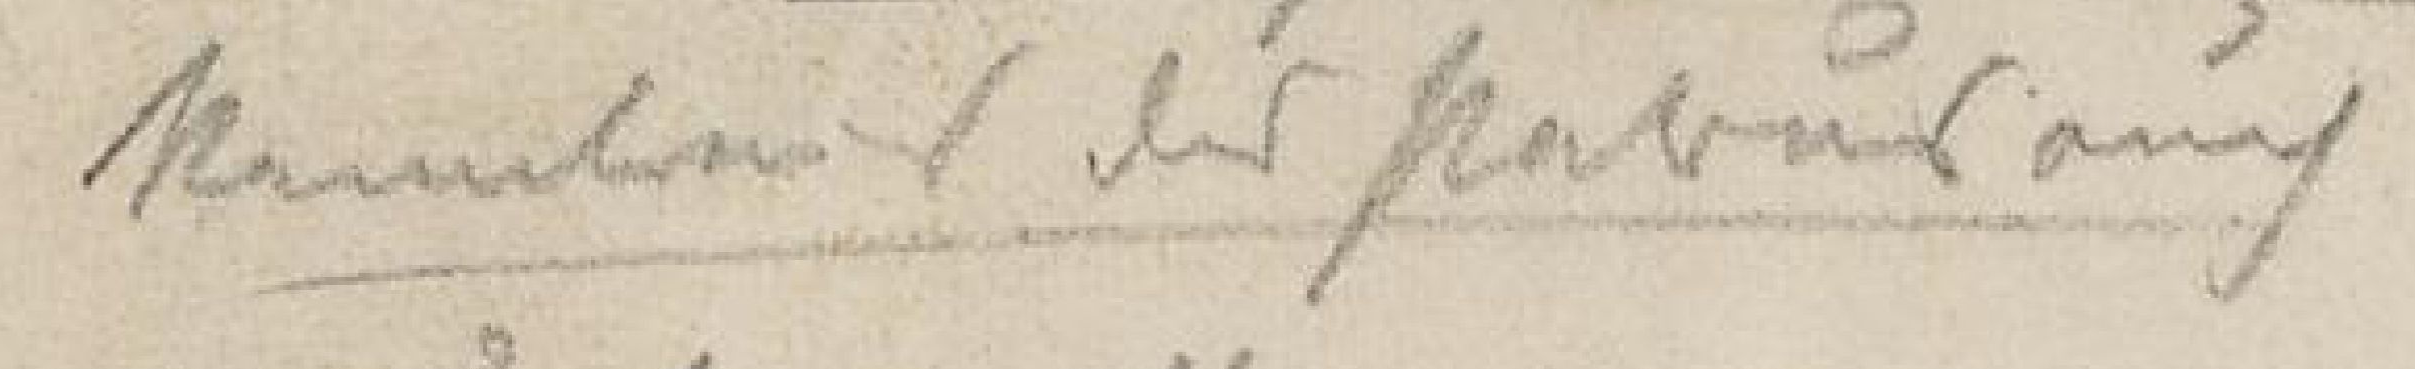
kenntnis des Petrus auch
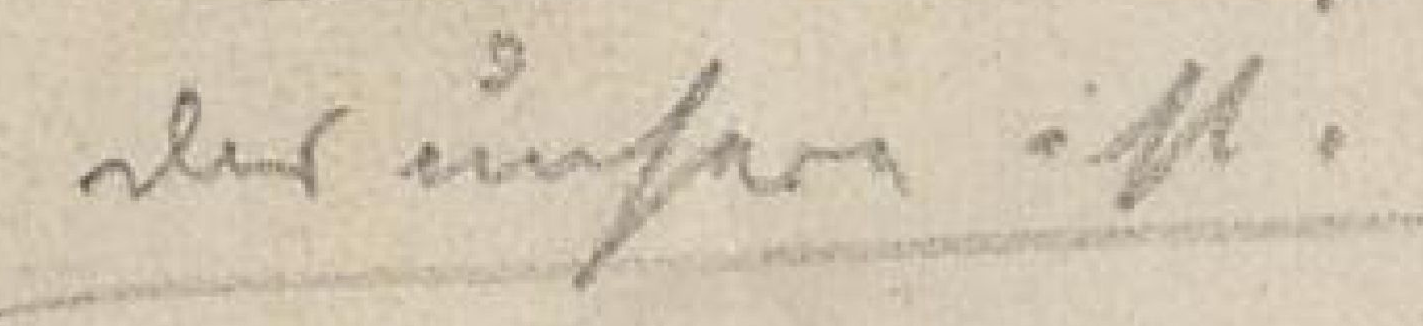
das unsere ist.
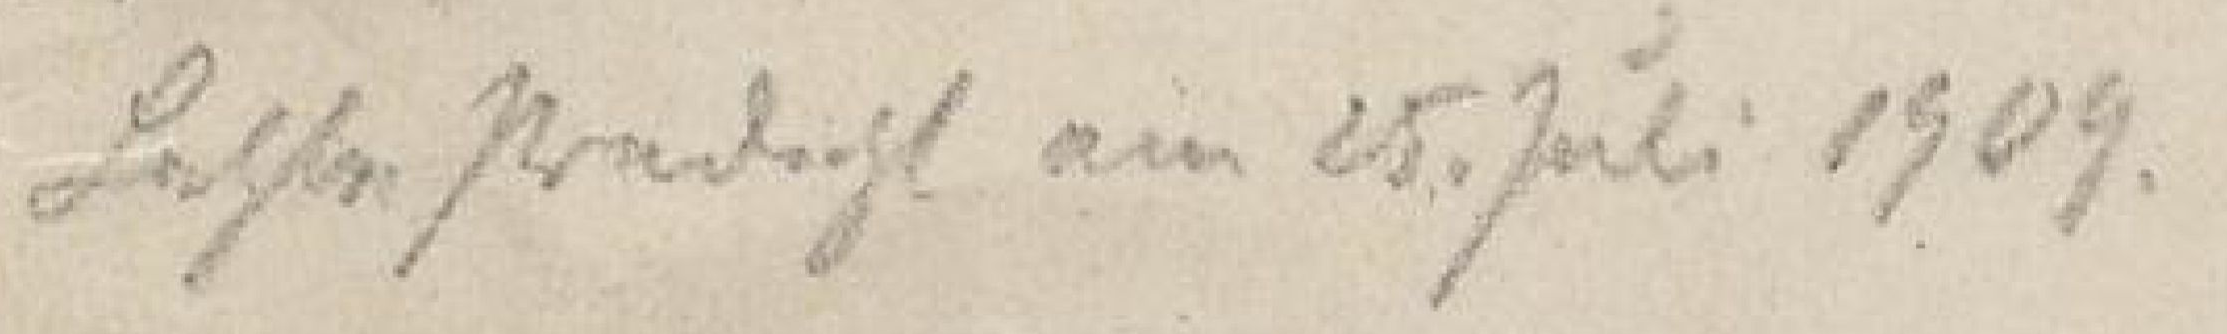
Letzte Predigt am 25. Juli 1909
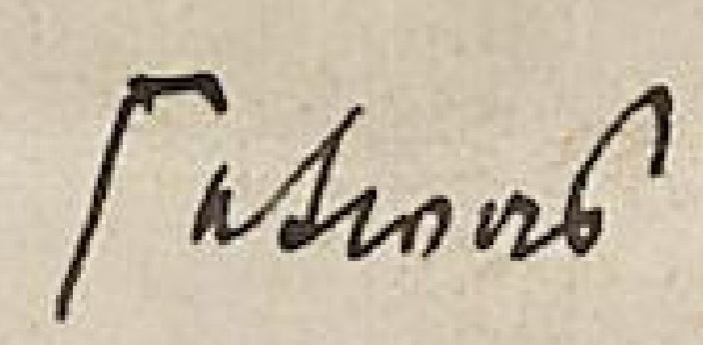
[ etwas
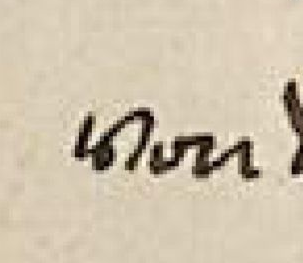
von
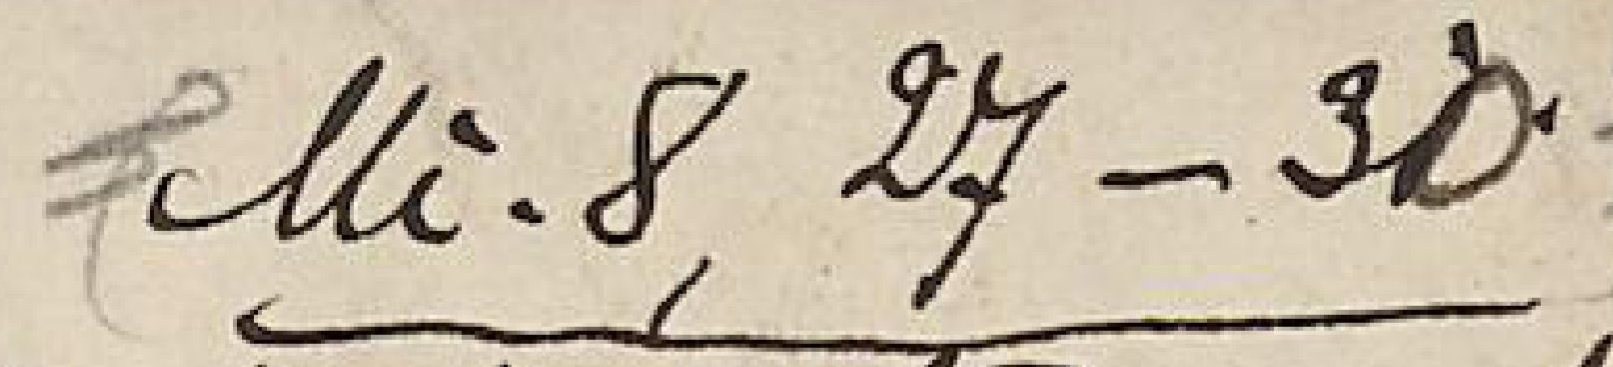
Mc. 8, 27-30
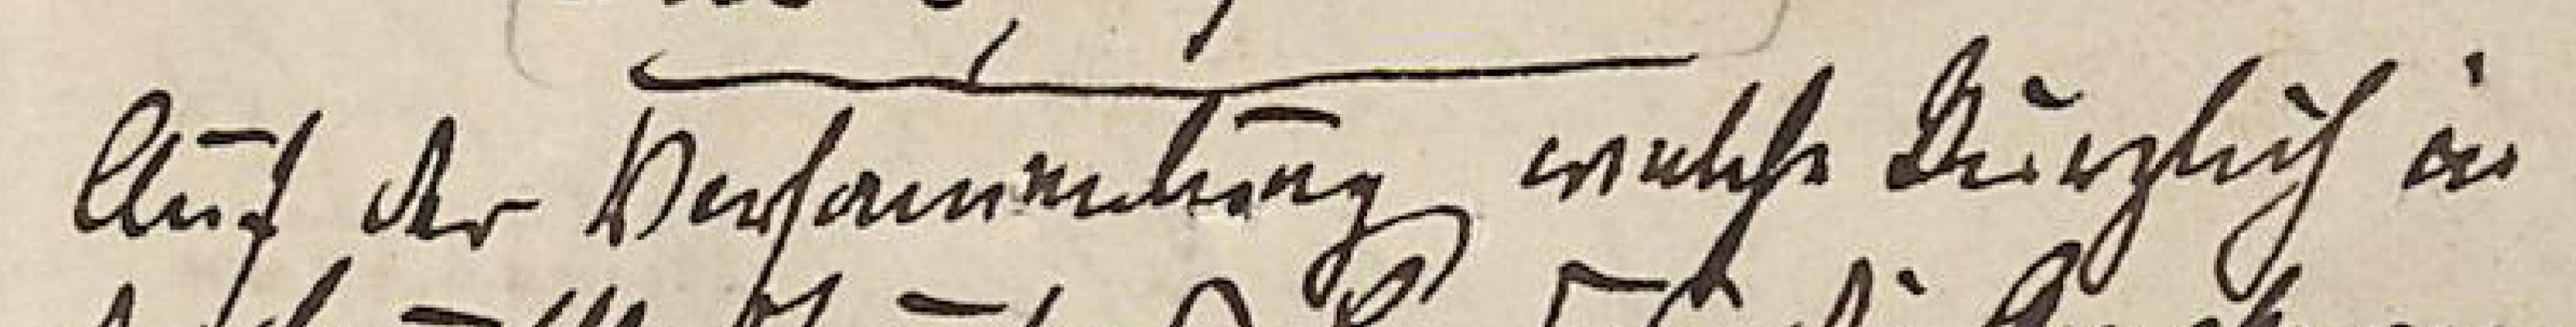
Auf der Versammlung, welche kürzlich in
